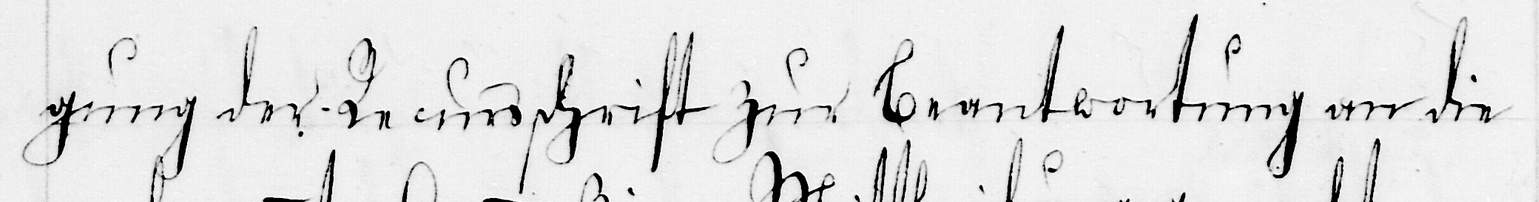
gung der Recursschrift zur Beantwortung an die
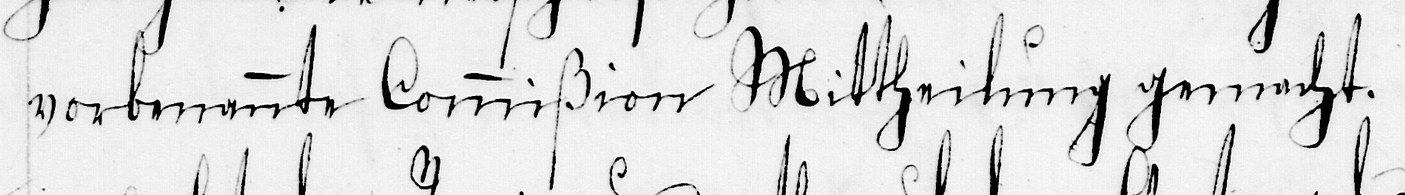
vorbenannte Commißion Mittheilung gemacht.
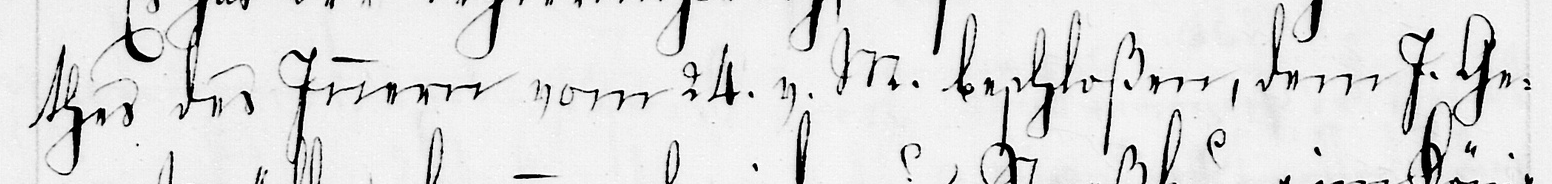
thes des Innern vom 24. v. M. beschloßen, dem J. Ge¬
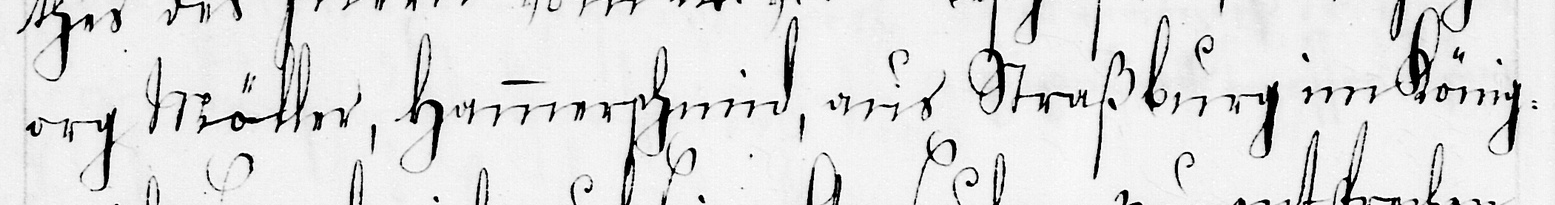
org Möller, Hammerschmid, aus Straßburg im König¬
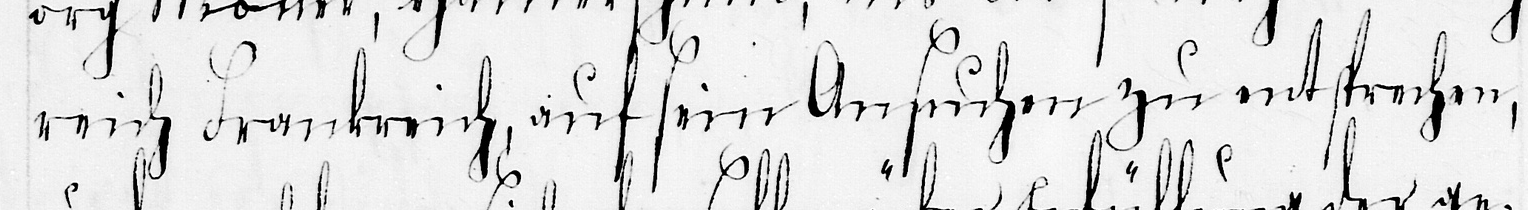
reich Frankreich, auf sein Ansuchen zu entsprechen,
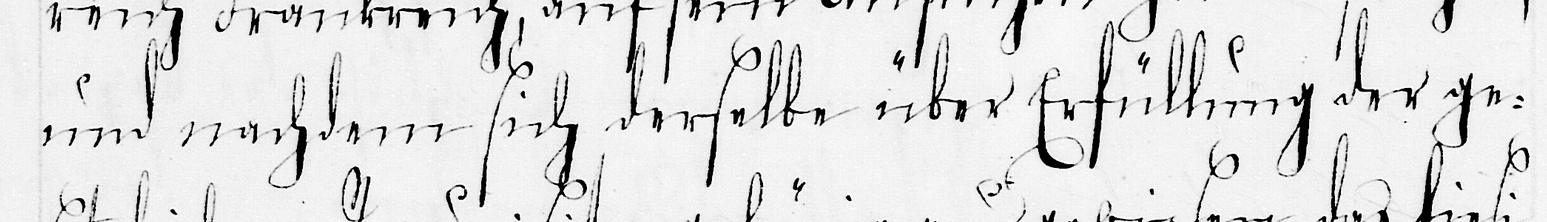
und nachdem sich derselbe über Erfüllung der ge¬
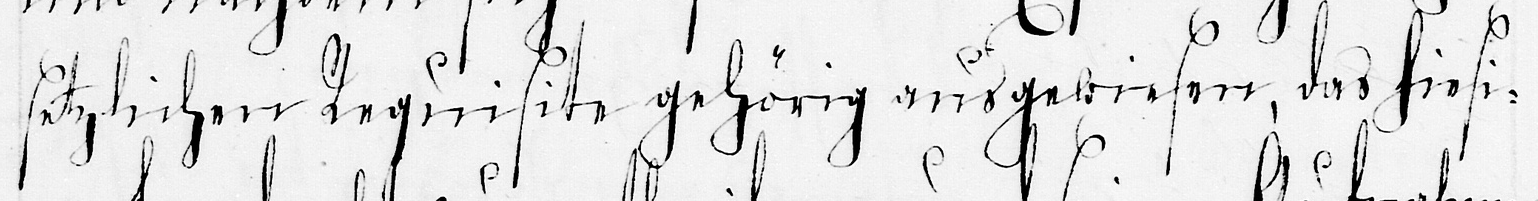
setzlichen Requisite gehörig ausgewiesen, das hiesi¬
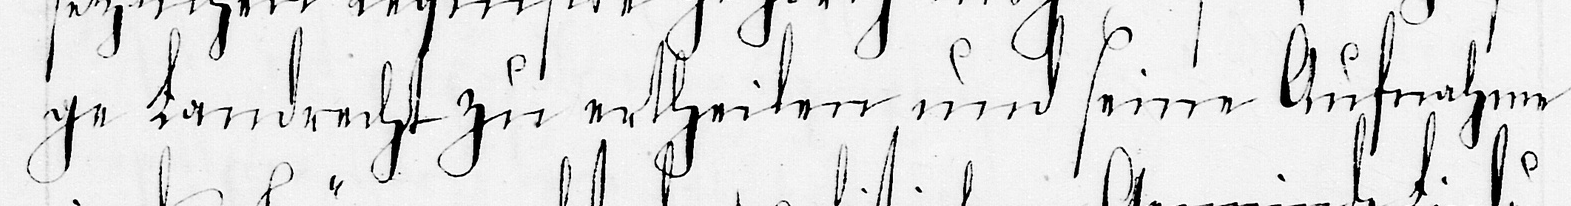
ge Landrecht zu ertheilen und seine Aufnahme
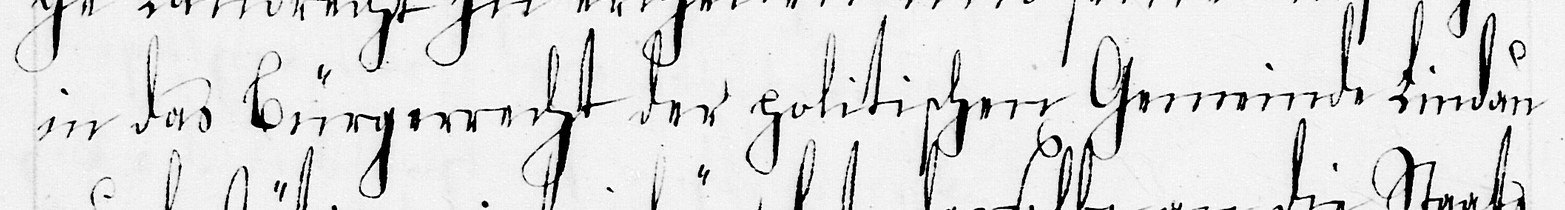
in das Bürgerrecht der politischen Gemeinde Lindau
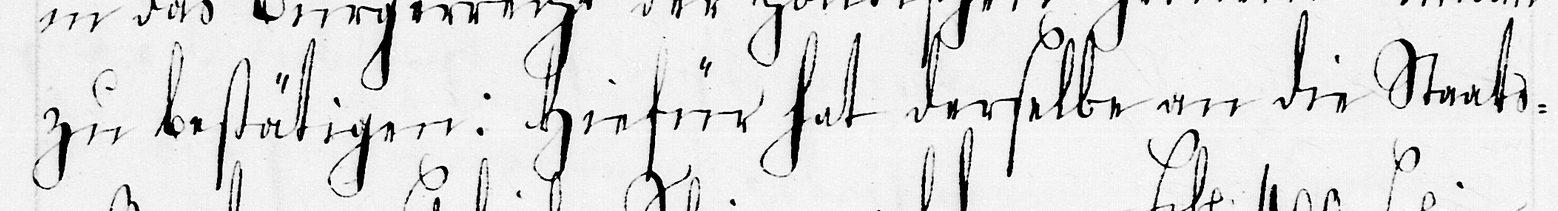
zu bestätigen: Hiefür hat derselbe an die Staats¬
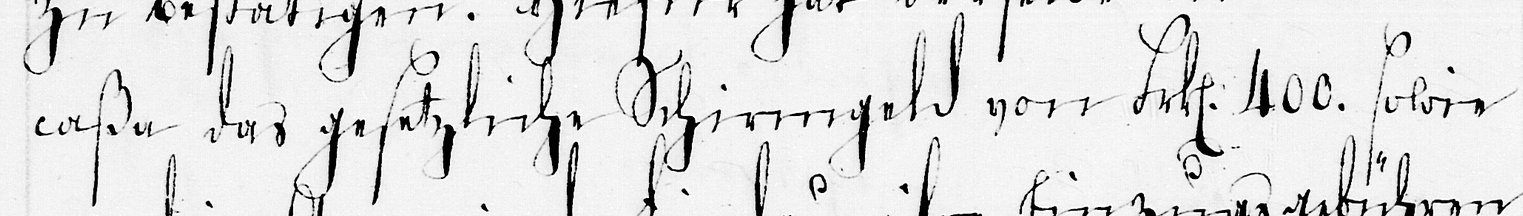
caßa das gesetzliche Schirmgeld von Frk[en]. 400. sowie
